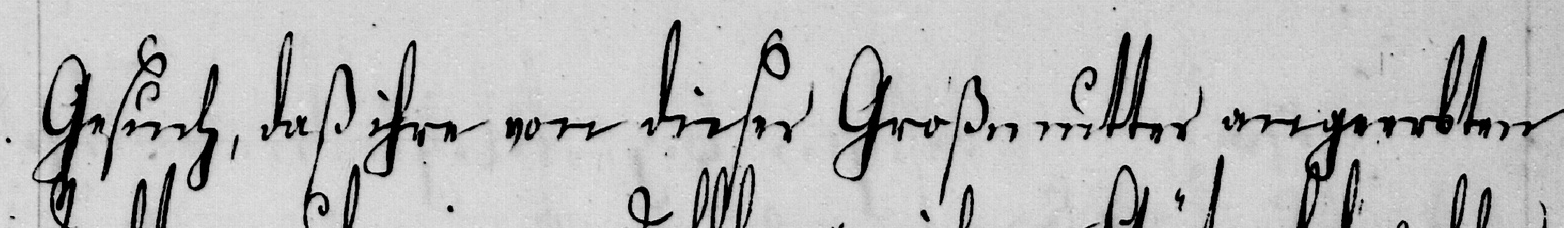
Gesuch, daß ihre von dieser Großmutter angeerbten
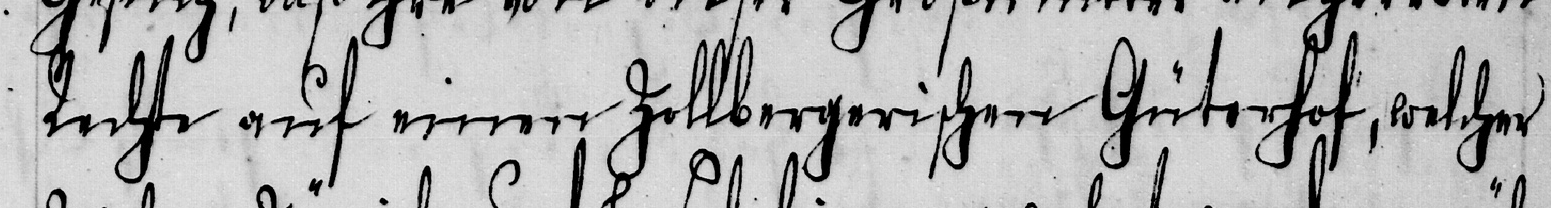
Rechte auf einen Zollbergerischen Güterhof, welcher
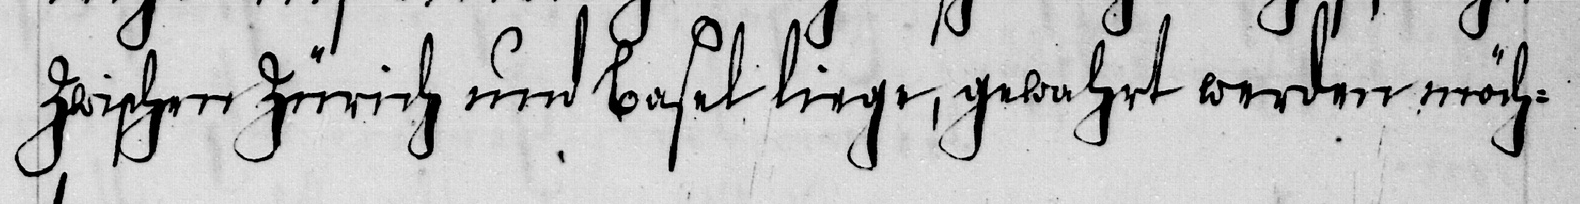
zwischen Zürich und Basel liege, gewahrt werden möch¬
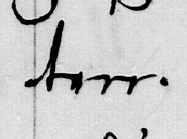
ten.
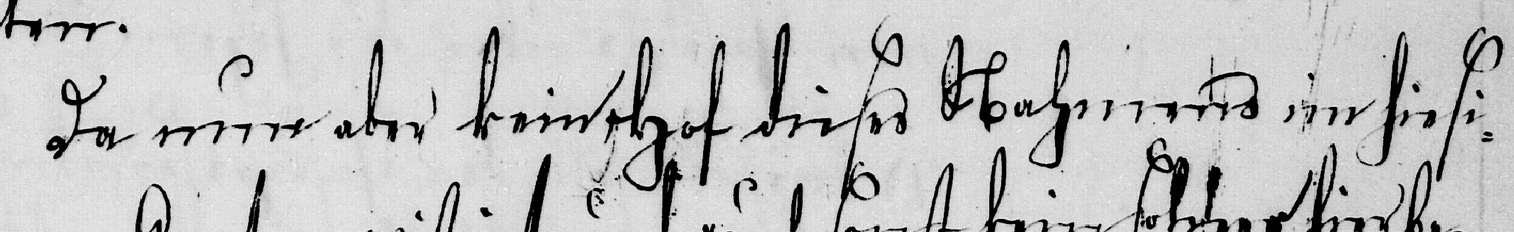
Da nun aber kein Hof dieses Nahmens im hiesi¬
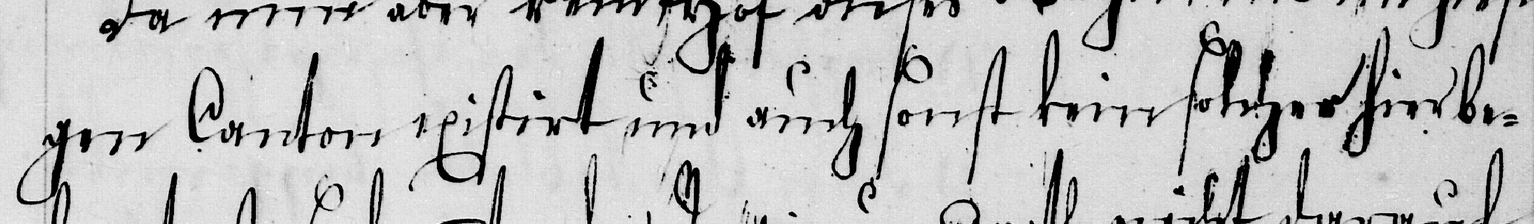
gen Canton existirt und auch sonst kein solcher hier b¬
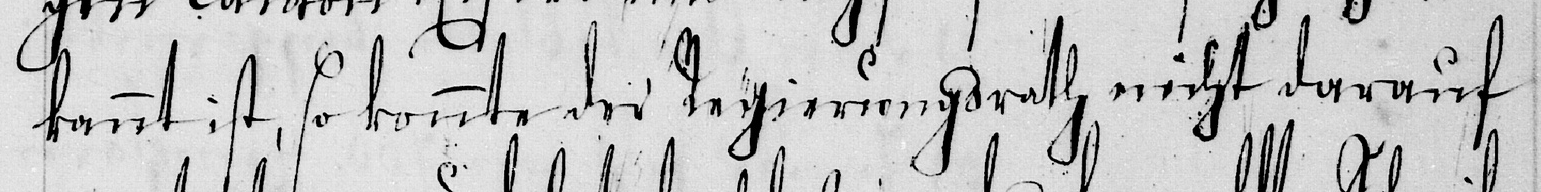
kannt ist, so konnte der Regierungsrath nicht darauf
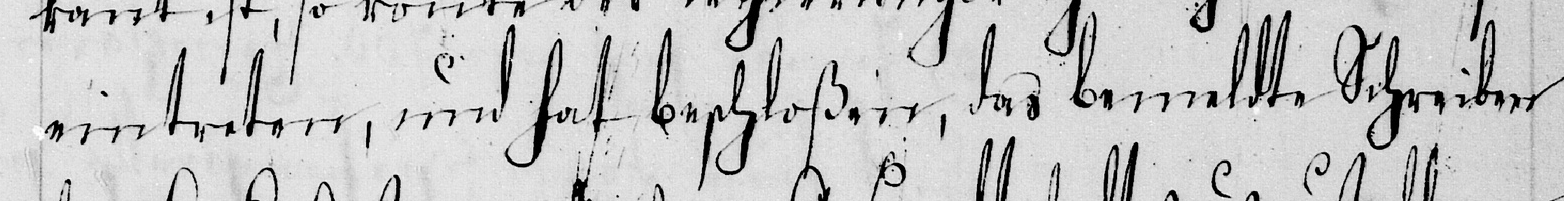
eintreten, und hat beschloßen, das bemeldte Schreiben
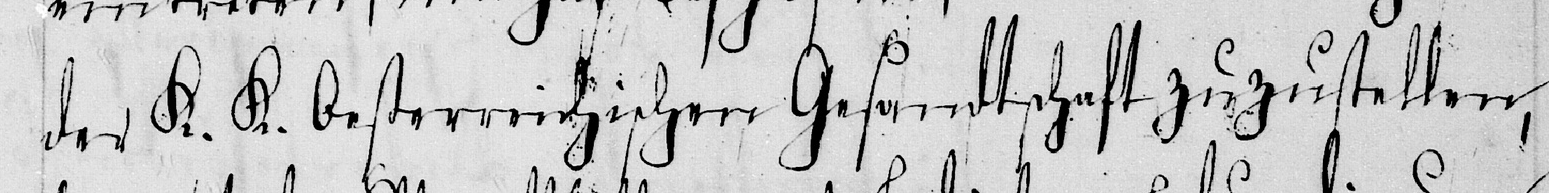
der K. K. Oesterreichischen Gesandtschaft zuzustellen,
